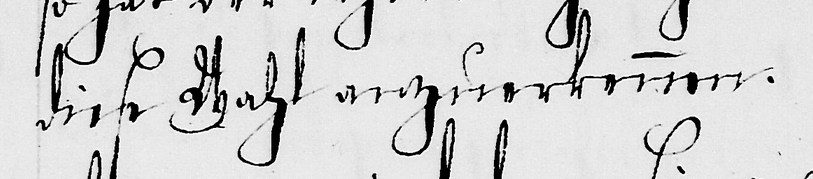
diese Wahl anzuerkennen.
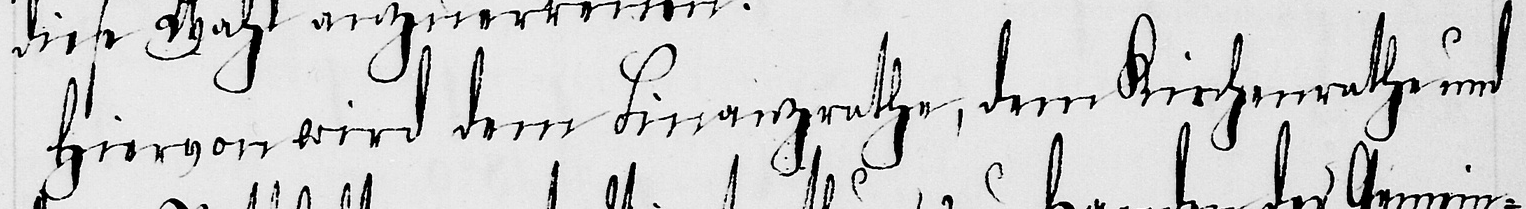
Hiervon wird dem Finanzrathe, dem Kirchenrathe und
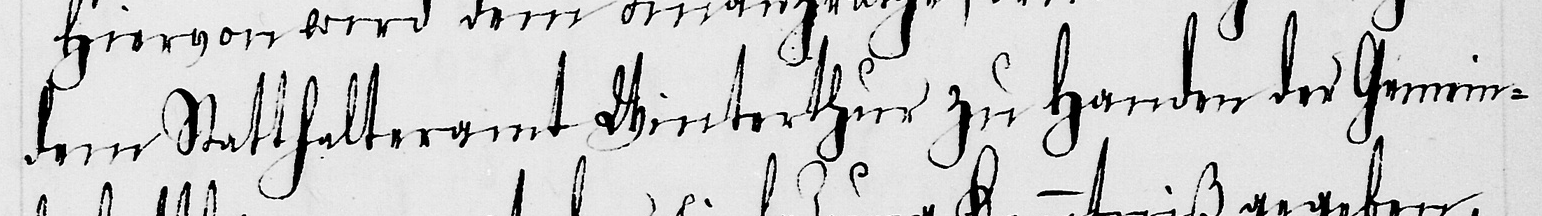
dem Statthalteramt Winterthur zu Handen der Gemein¬
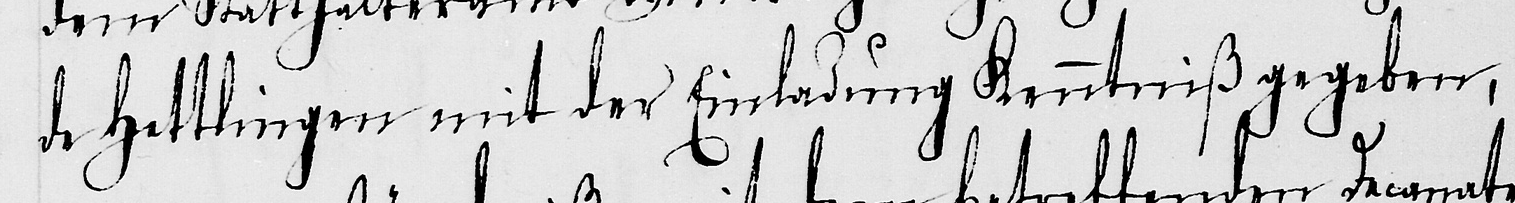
de Hettlingen mit der Einladung Kenntniß gegeben,
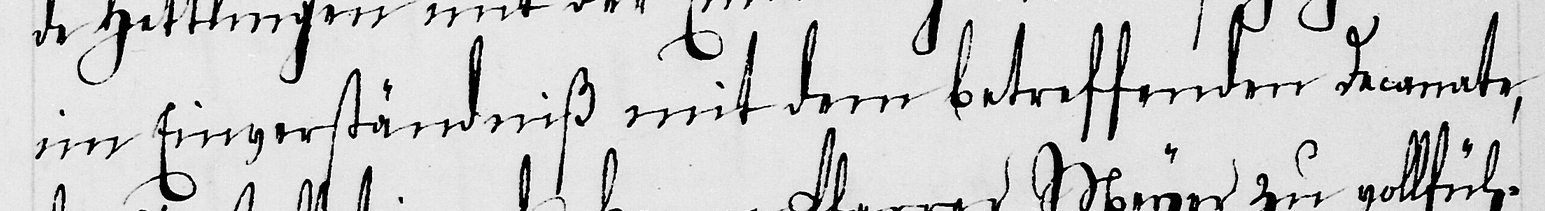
im Einverständniß mit dem betreffenden Decanate,
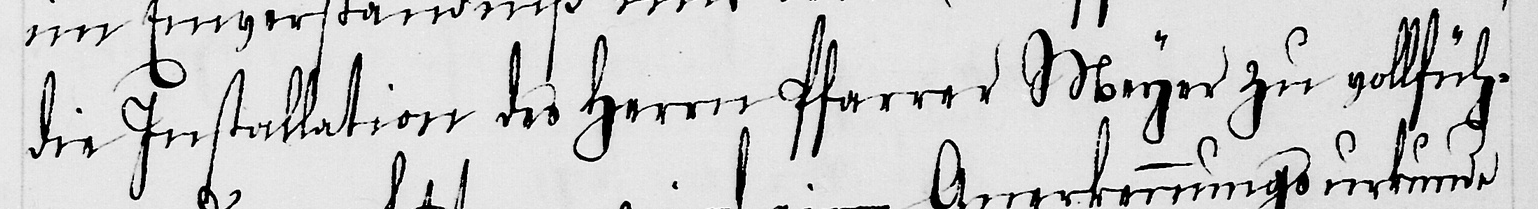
die Installation des Herrn Pfarrer Meyer zu vollfüh¬
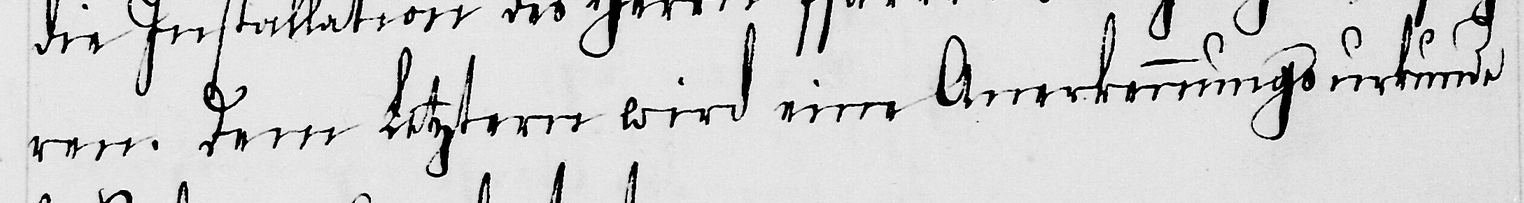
ren. Dem Letztern wird eine Anerkennungsurkunde
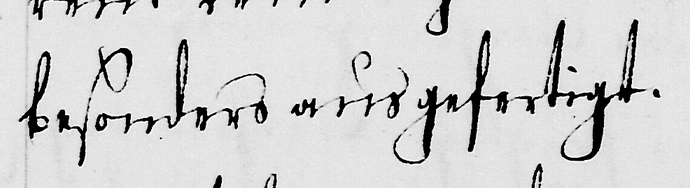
besonders ausgefertigt.
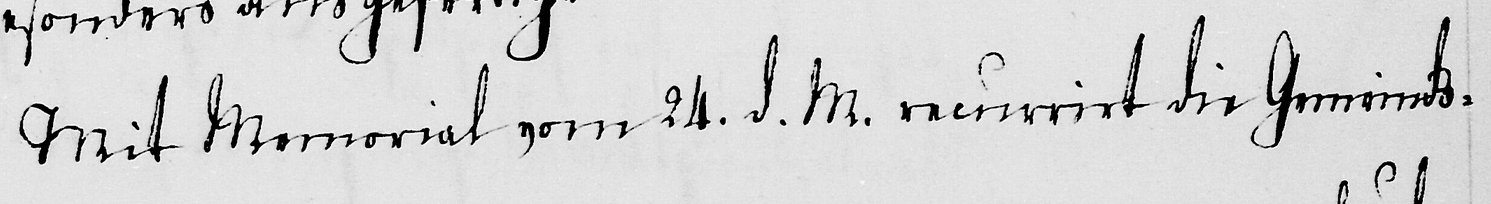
Mit Memorial vom 24. d. M. recurrirt die Gemeinds-
